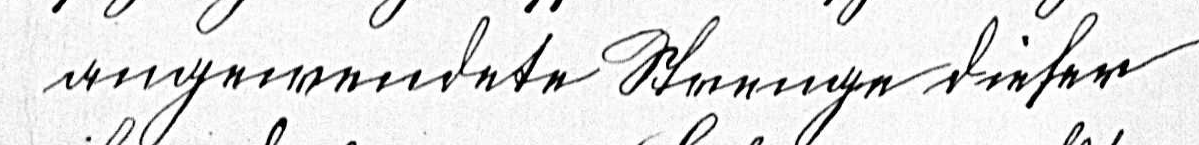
angewendete Strenge dieser
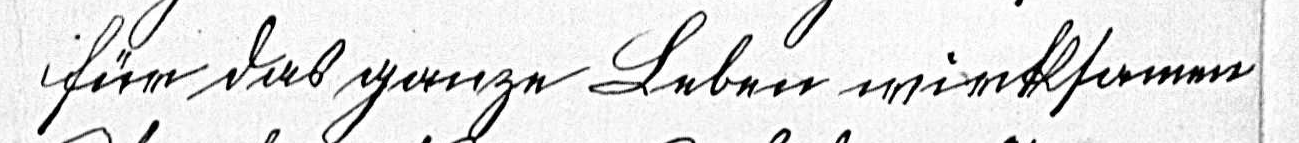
für das ganze Leben wirksamen
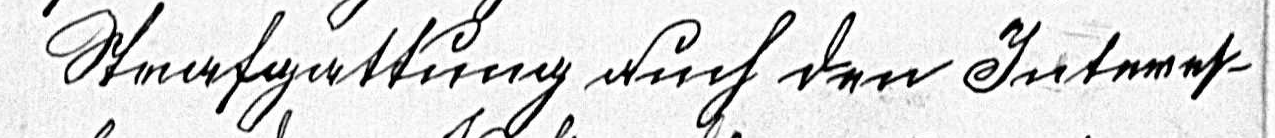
Strafgattung auch den Interessen
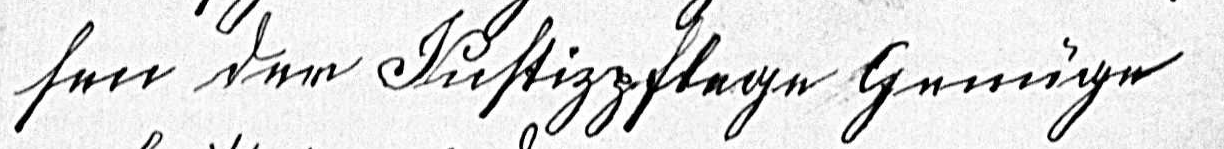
der Justizpflege Genüge
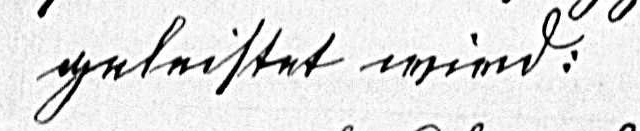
geleistet wird:
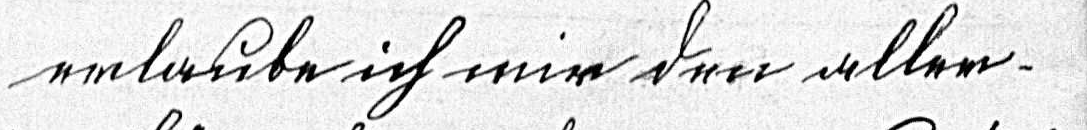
Erlaube ich mir den aller¬
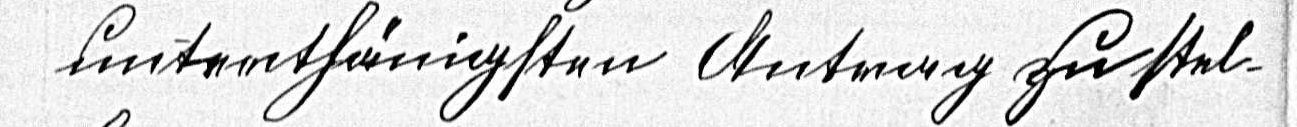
unterthänigsten Antrag zu stel¬
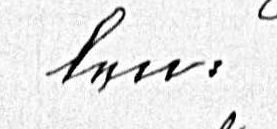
len:
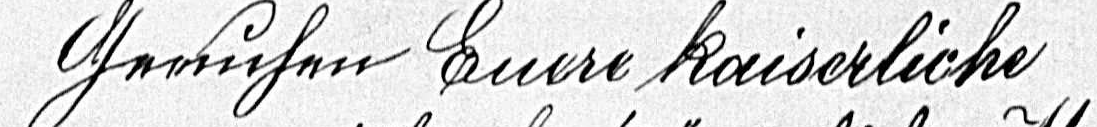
Geruhen Euere kaiserliche
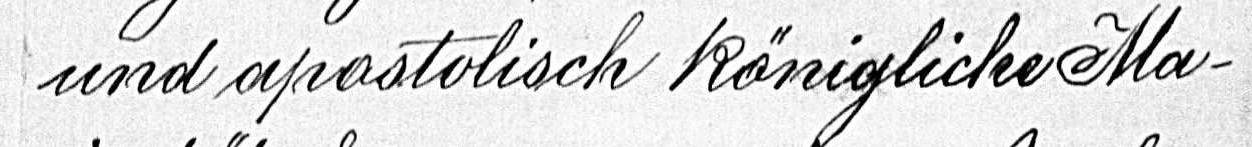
und apostolisch königliche Ma¬
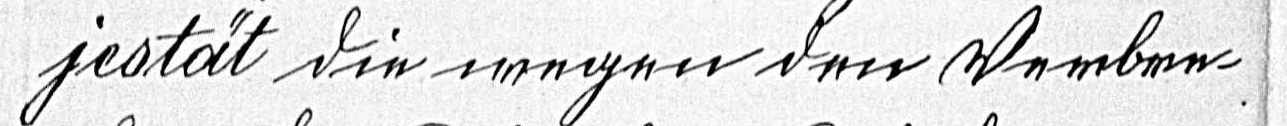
jestät die wegen den Verbre¬
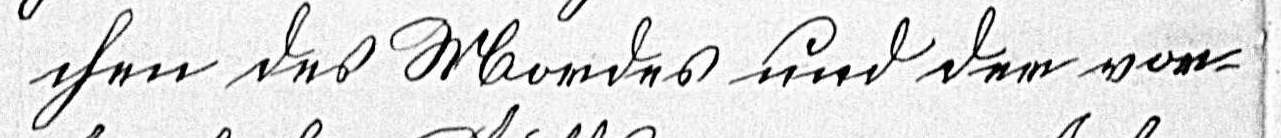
chen des Mordes und der vor¬
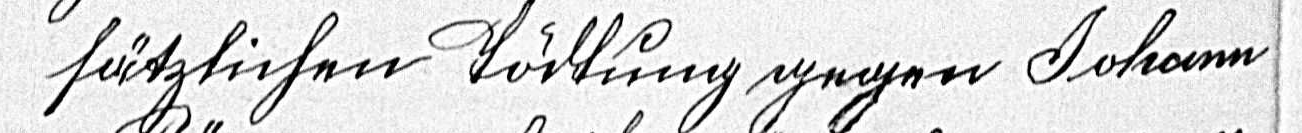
sätzlichen Tödtung gegen Johann
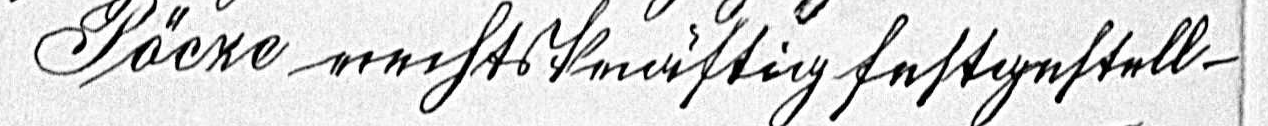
Pöcze rechtskräftig festgestell¬
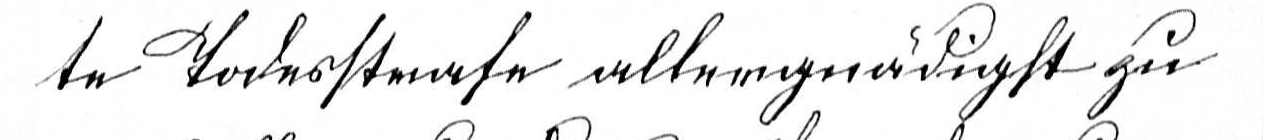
te Todesstrafe allergnädigst zu
